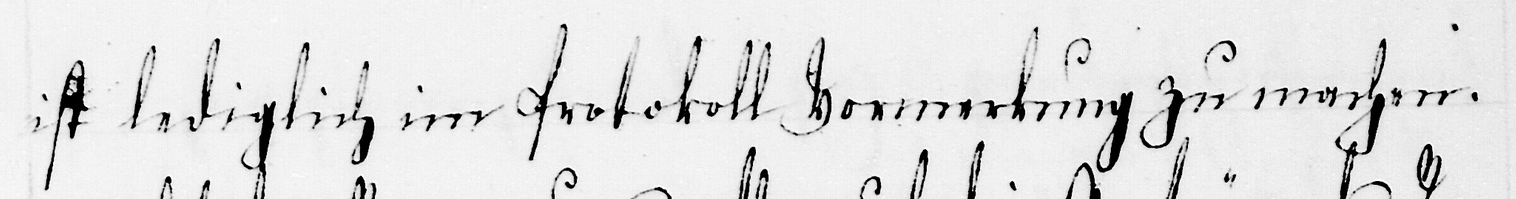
ist lediglich im Protokoll Vormerkung zu machen.
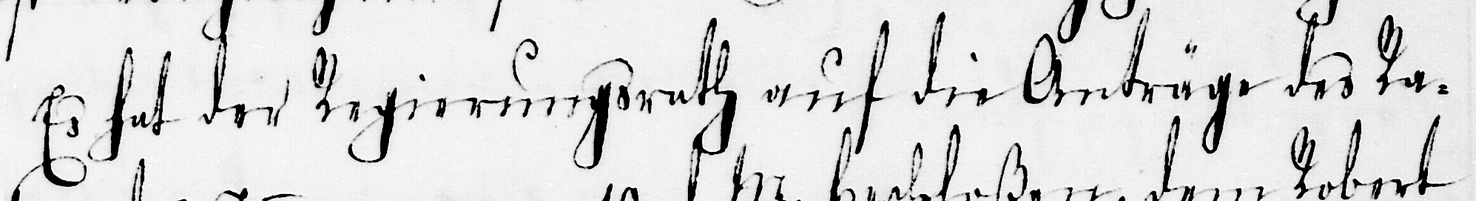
Es hat der Regierungsrath auf die Anträge des Ra¬
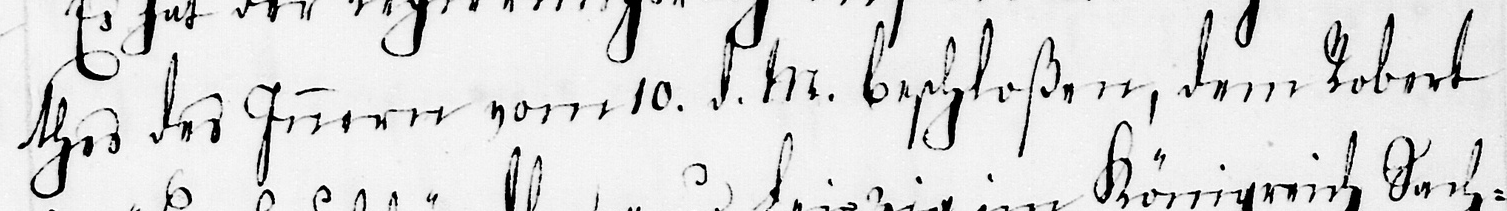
thes des Innern vom 10. d. M. beschloßen, dem Robert
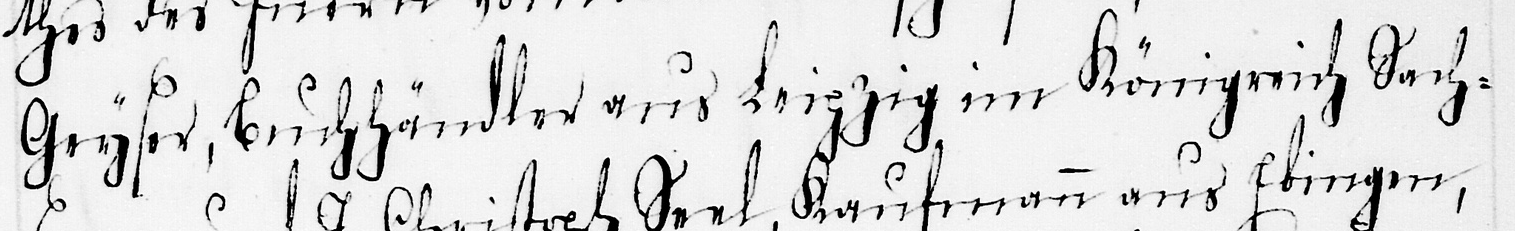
Geyser, Buchhändler aus Leipzig im Königreich Sach¬
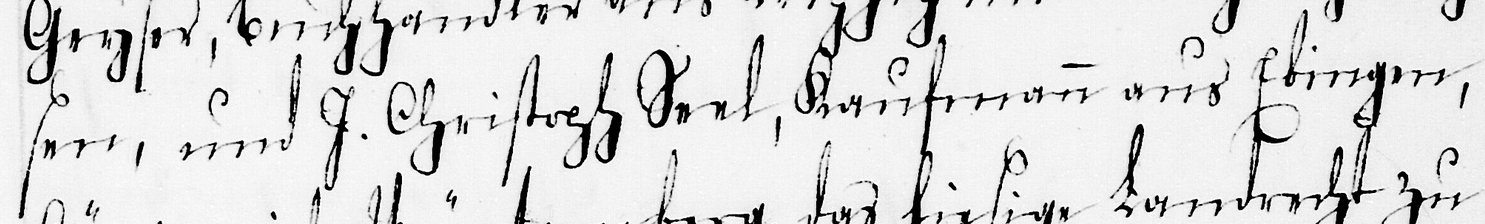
sen, und J. Christoph Seel, Kaufmann aus Ebingen,
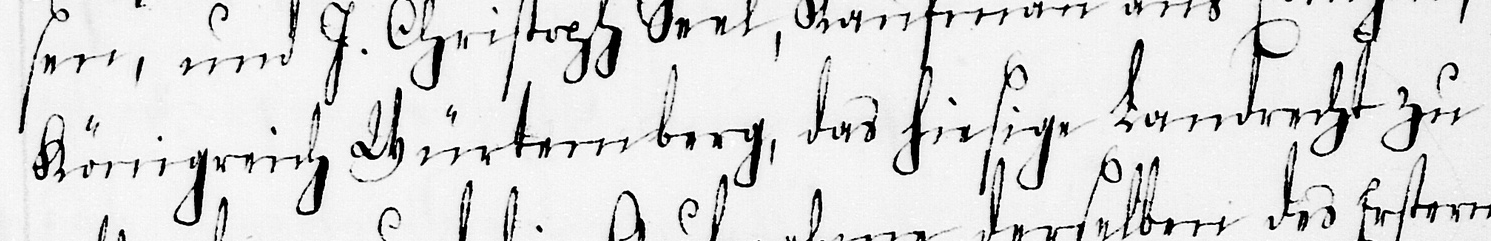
Königreich Würtemberg, das hiesige Landrecht zu
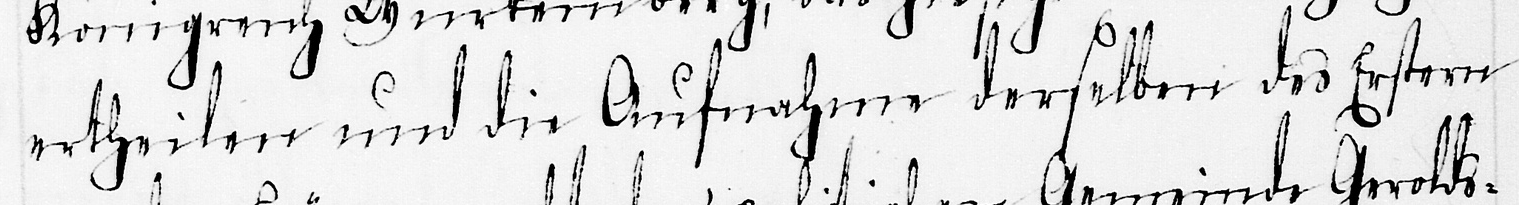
ertheilen und die Aufnahme derselben des Erstern
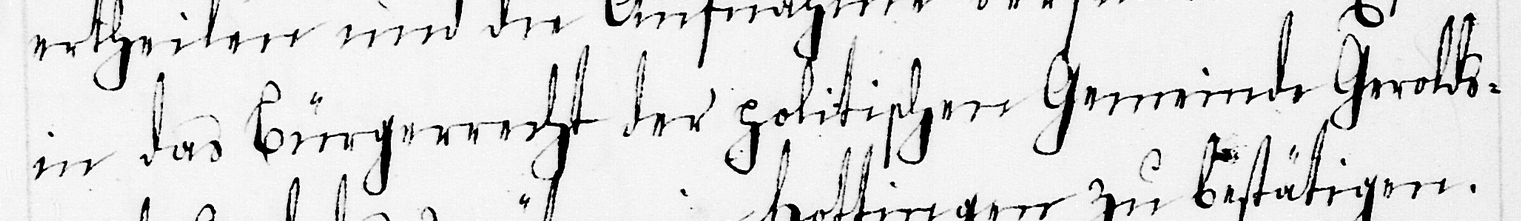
in das Bürgerrecht der politischen Gemeinde Gerolds¬
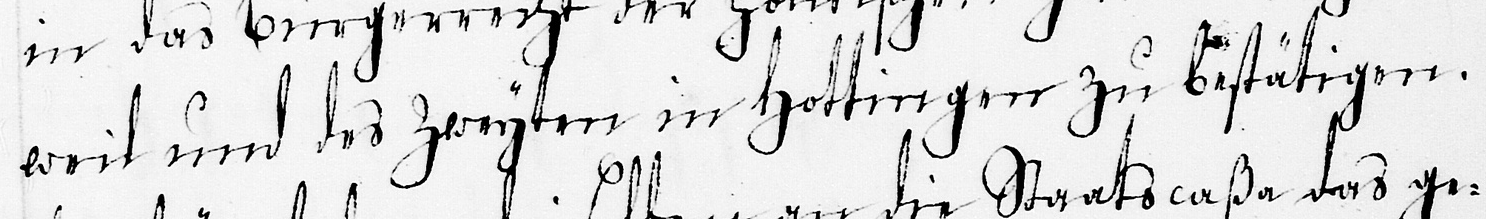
weil und des Zweyten in Hottingen zu bestätigen.
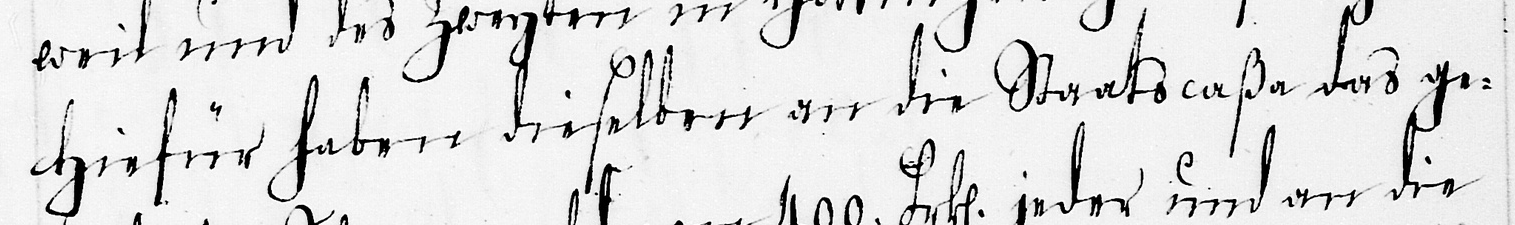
Hiefür haben dieselben an die Staatscaßa das ge¬
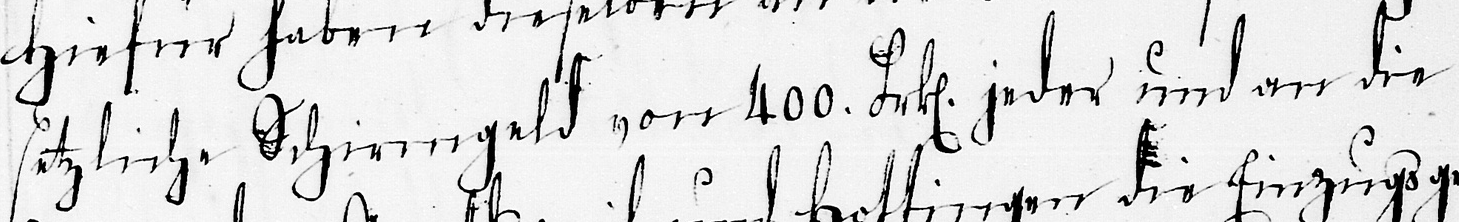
setzliche Schirmgeld von 400. Frk[en]. jeder und an die
